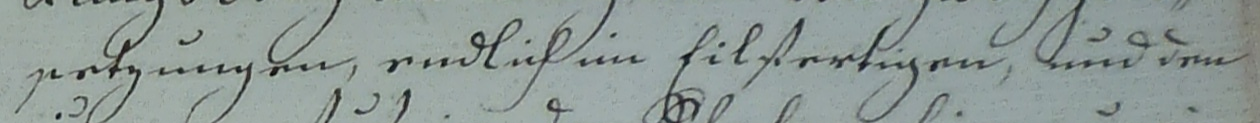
setzungen, endlich im Eilfertigen, und den
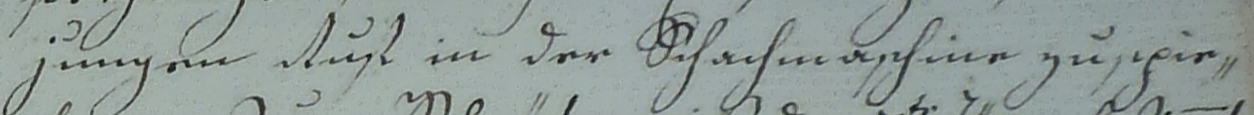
jungen Ruf in der Schachmaschine zu spie¬
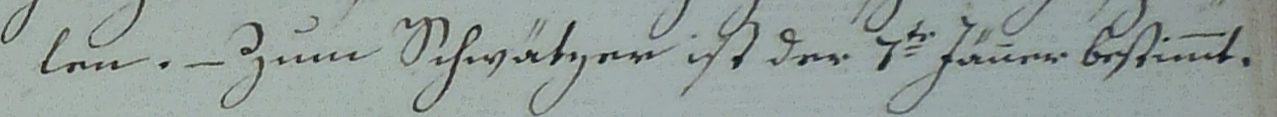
len. _ Zum Schwätzer ist der 7te Jäner bestimt.
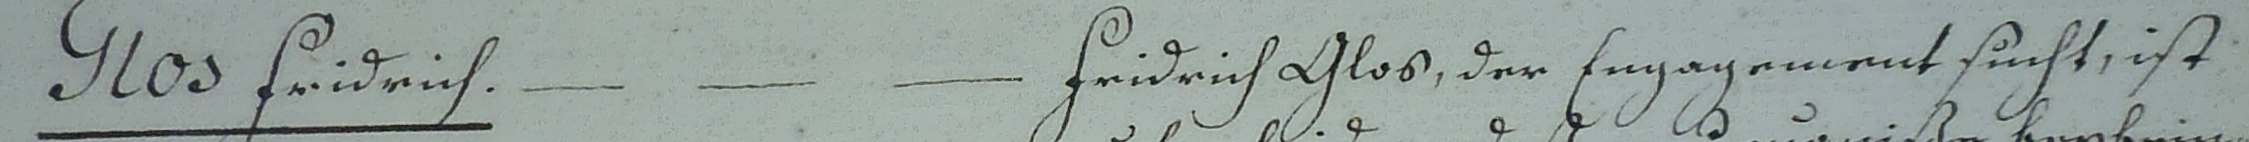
Glos Fridrich. _ _ _ Fridrich Glos, der Engagement sucht, ist
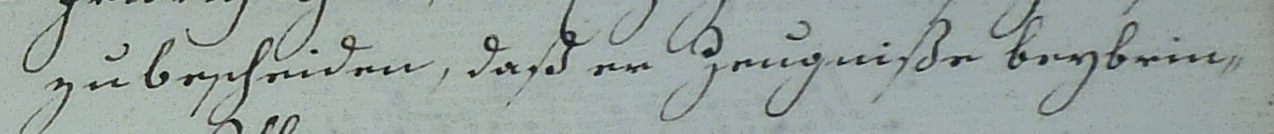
zubescheiden, daß er Zeugniße beybrin¬
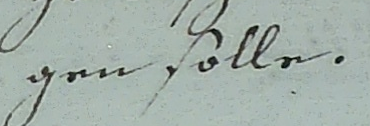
gen solle.
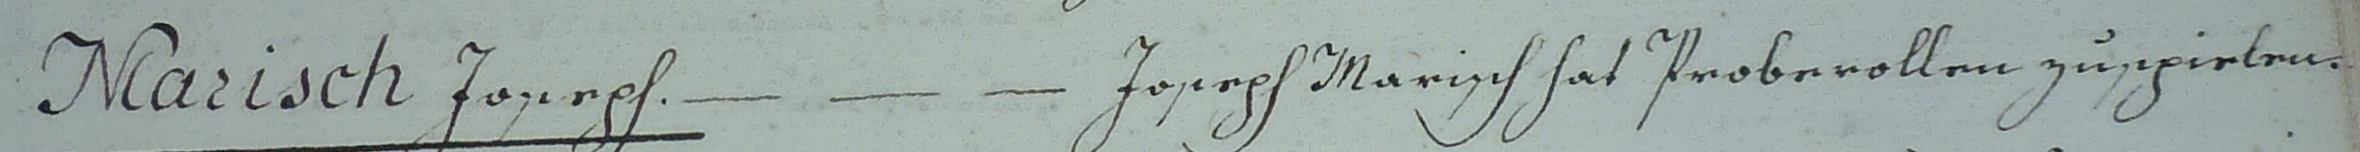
Marisch Joseph. _ _ _ Joseph Marisch hat Proberollen zuspielen.
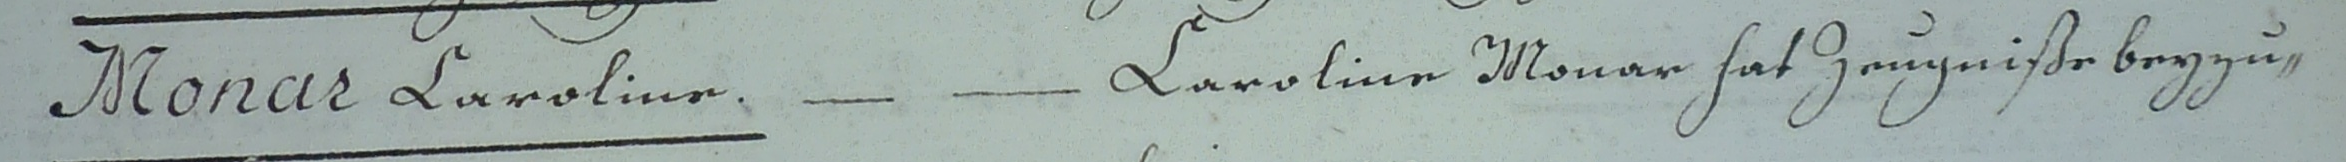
Monar Caroline. _ _ Caroline Monar hat Zeugniße beyzu¬
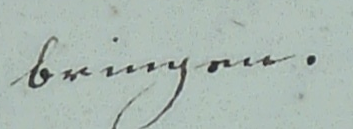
bringen.
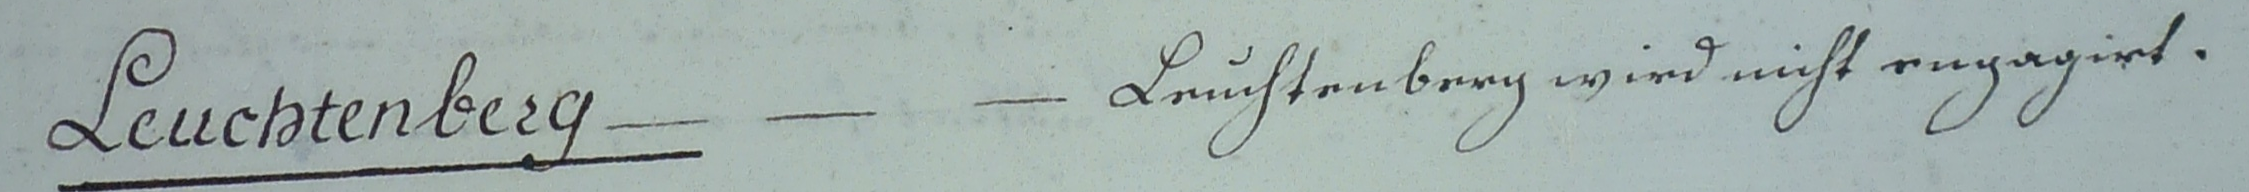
Leuchtenberg _ _ _ Leuchtenberg wird nicht engagirt.
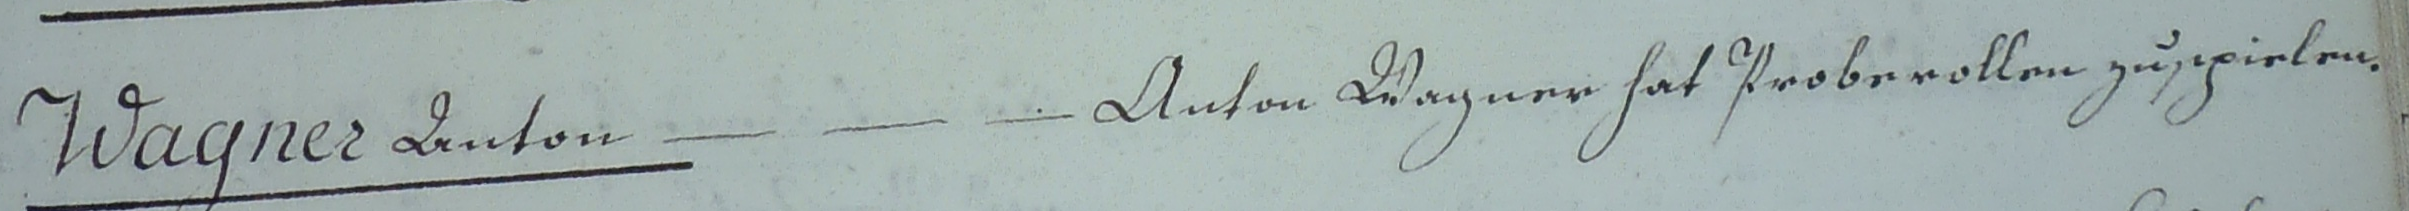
Wagner Anton _ _ _ Anton Wagner hat Proberollen zuspielen.
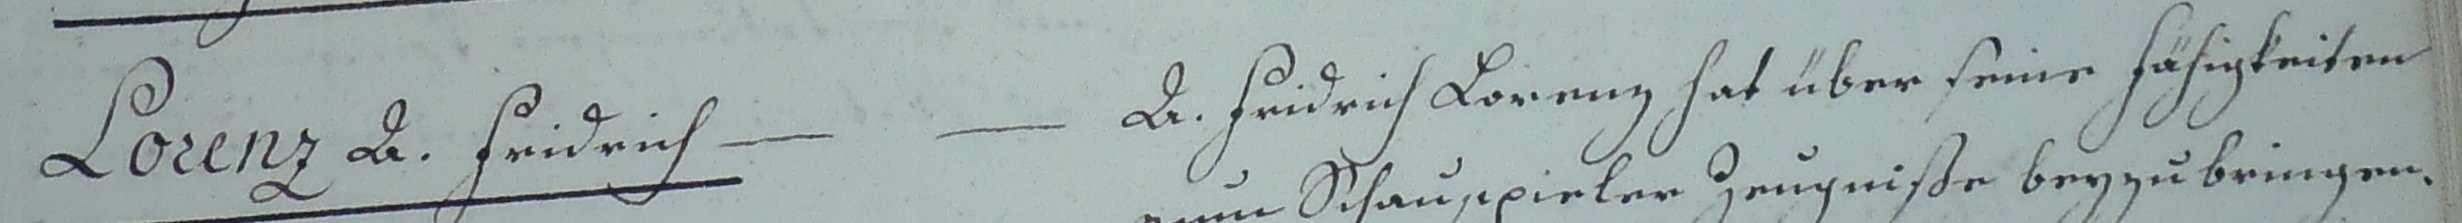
Lorenz A. Fridrich _ _ A. Fridrich Lorenz hat über seine Fähigkeiten
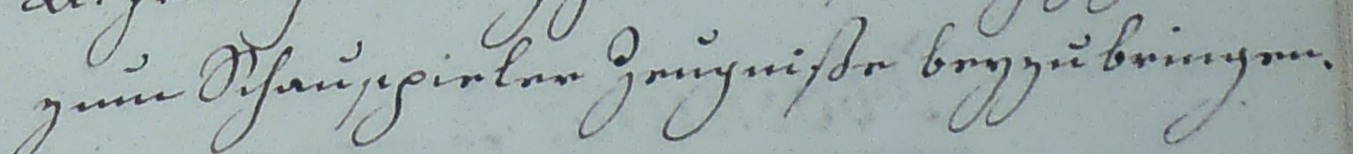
zum Schauspieler Zeugniße beyzubringen.
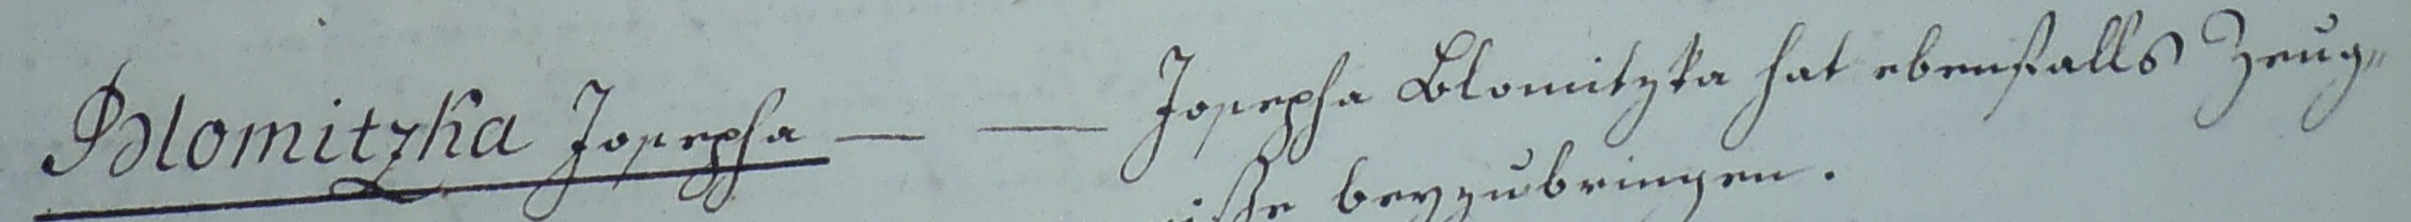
Blomitzka Josepha _ _ Josepha Blomitzka hat ebenfalls Zeug¬
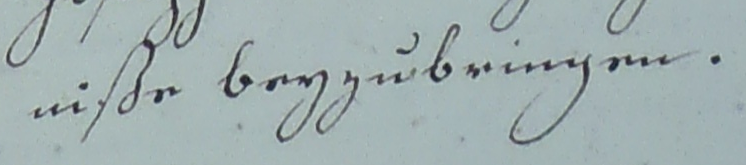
niße beyzubringen.
